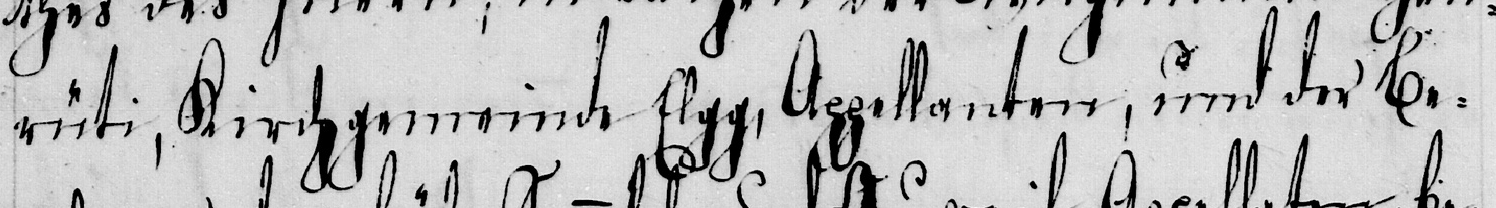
rüti, Kirchgemeinde Elgg, Appellanten, und der Be¬
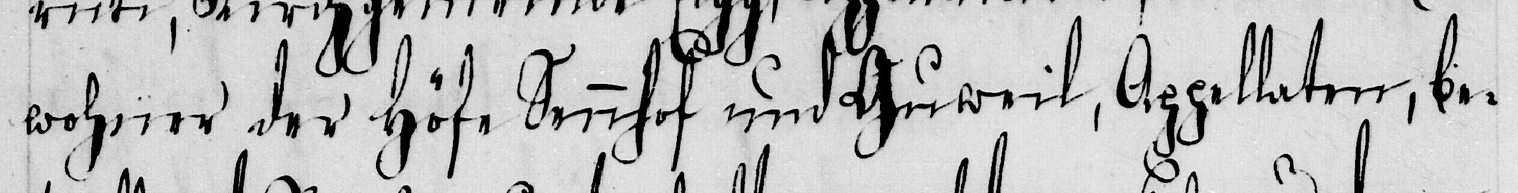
wohner der Höfe Sennhof und Guweil, Appellaten, be¬
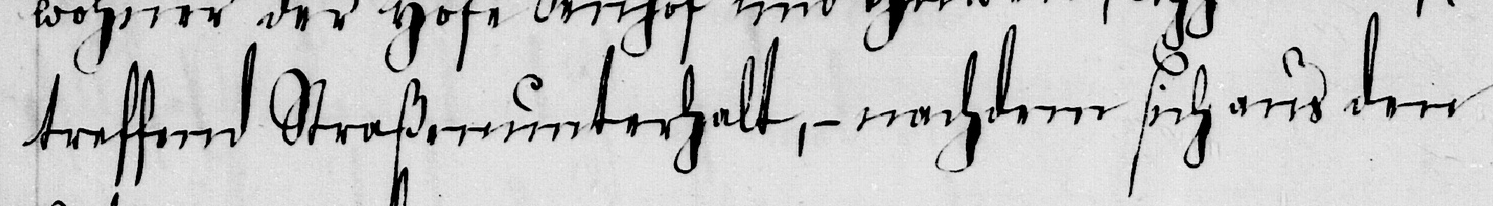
treffend Straßenunterhalt, – nachdem sich aus den
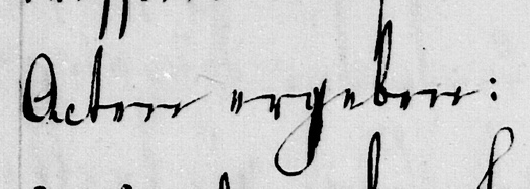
Acten ergeben:
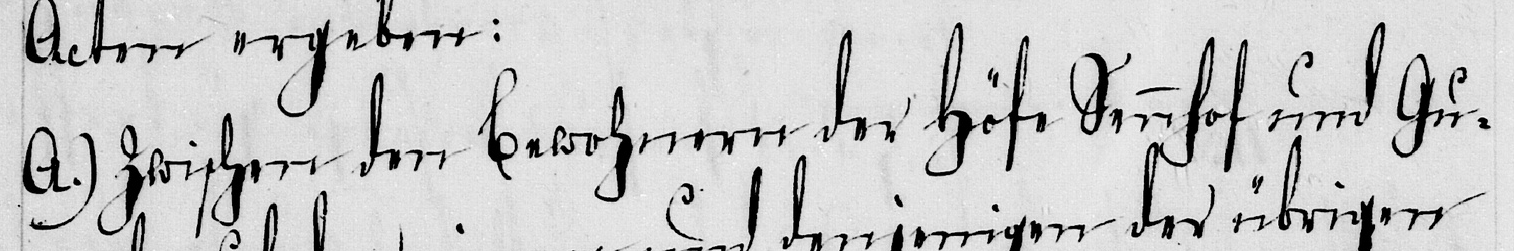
A.) Zwischen den Bewohnern der Höfe Sennhof und Gu¬
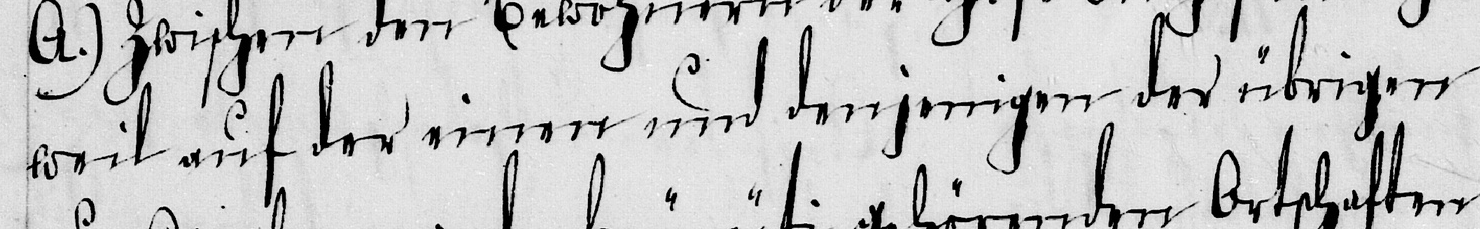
weil auf der einen und denjenigen der übrigen
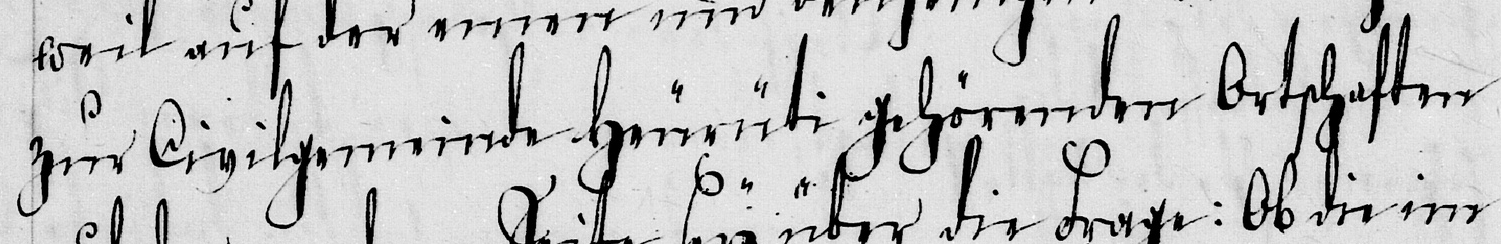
zur Civilgemeinde Heurüti gehörenden Ortschaften
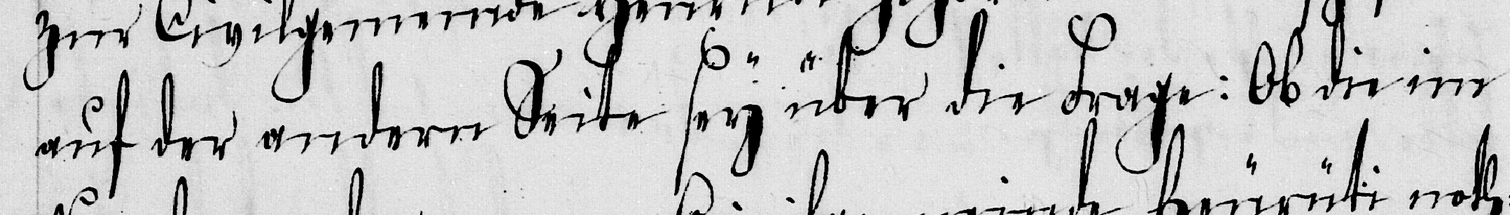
auf der andern Seite sey über die Frage: Ob die im
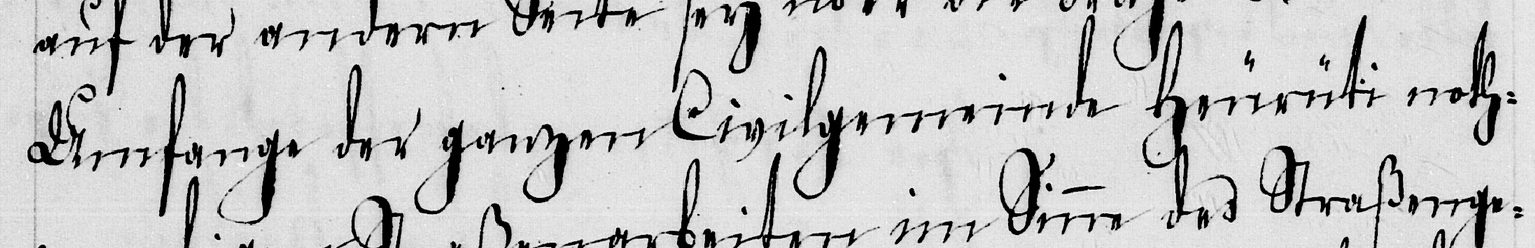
Umfange der ganzen Civilgemeinde Heurüti noth¬
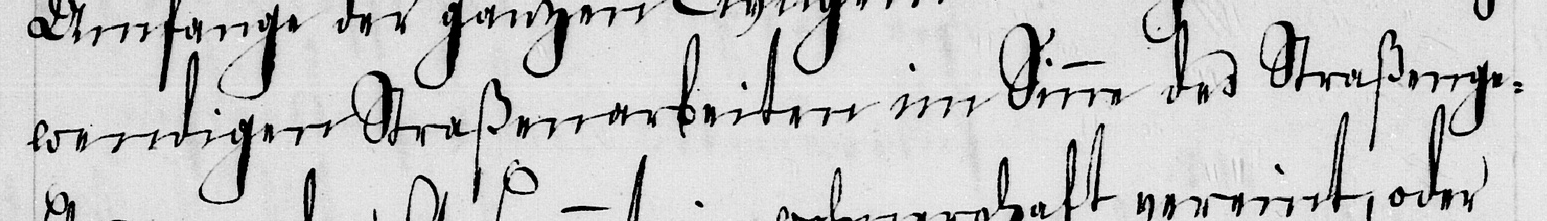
wendigen Straßenarbeiten im Sinne des Straßenge¬
